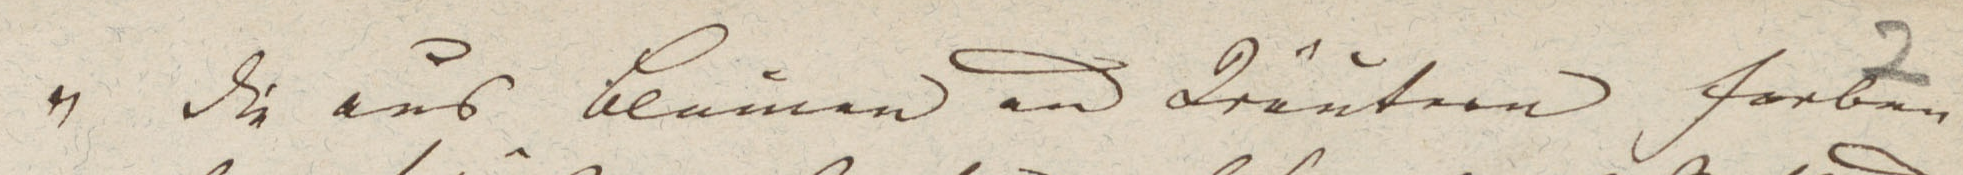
"die aus Blumen und Kräutern Farben
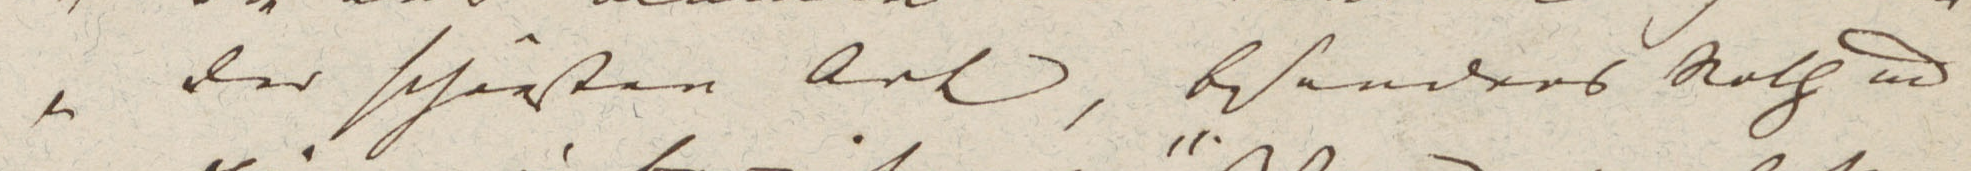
"der schönsten Art, besonders Roth und
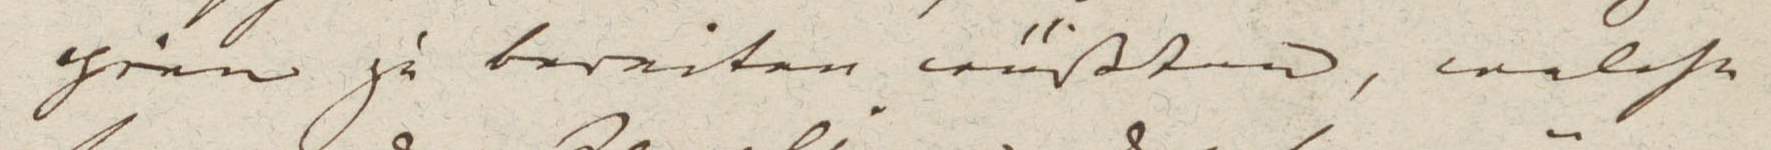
"Grün zu bereiten wüssten, welche
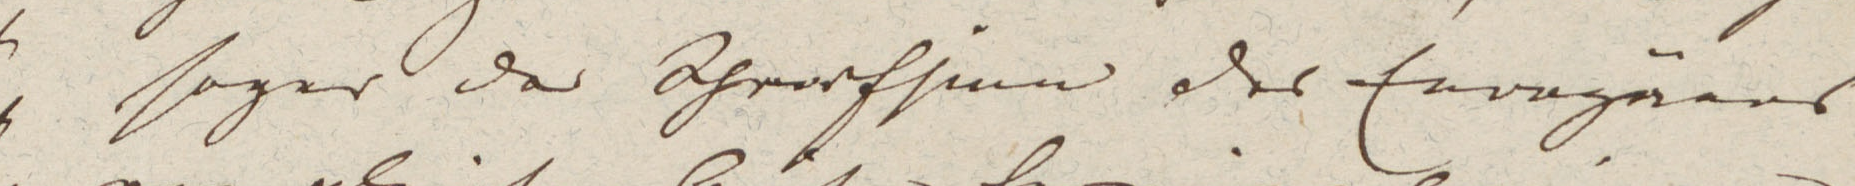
"sogar der Scharfsinn des Europäers
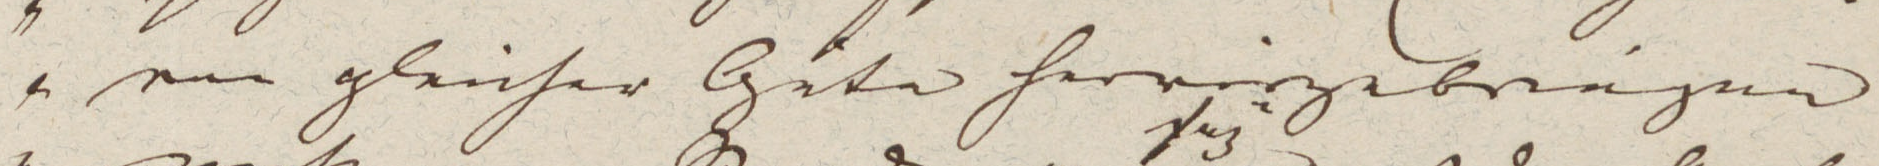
"von gleicher Güte hervorzubringen
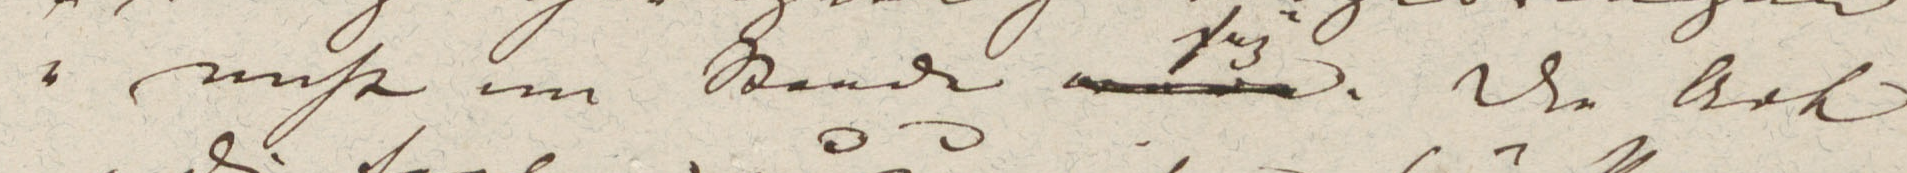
"nicht im Stande wäre sey. Die Art
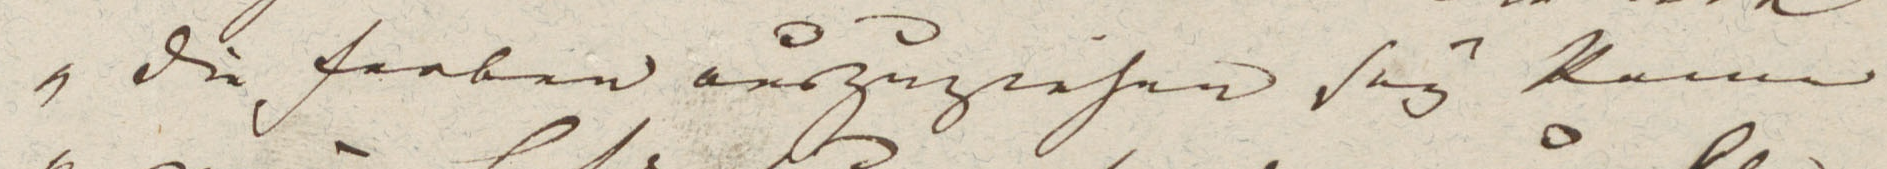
"die Farben auszuziehen sey keine
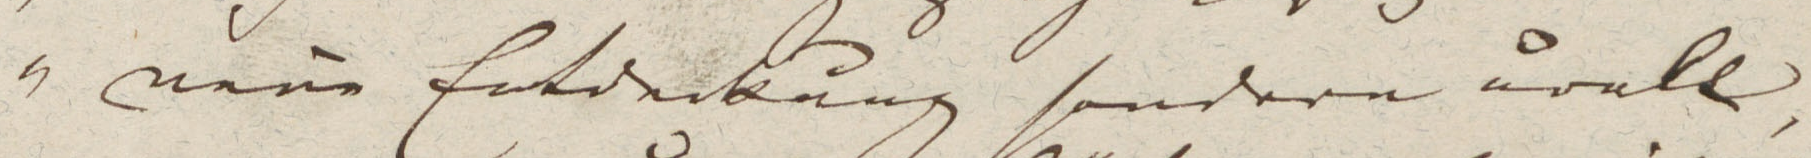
"neue Entdeckung sondern urallt,
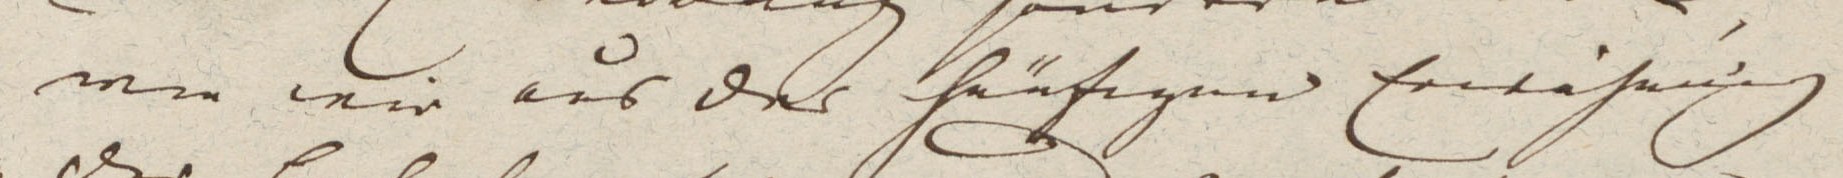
"wie wir aus der häufigen Erwähnung
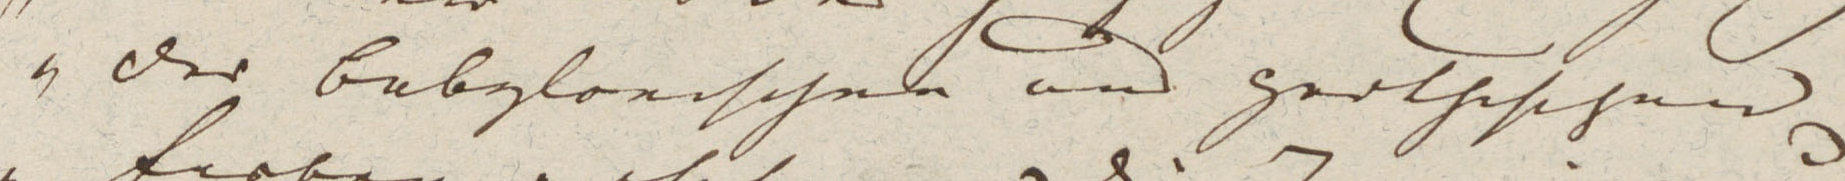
"der babylonischen und parthischen
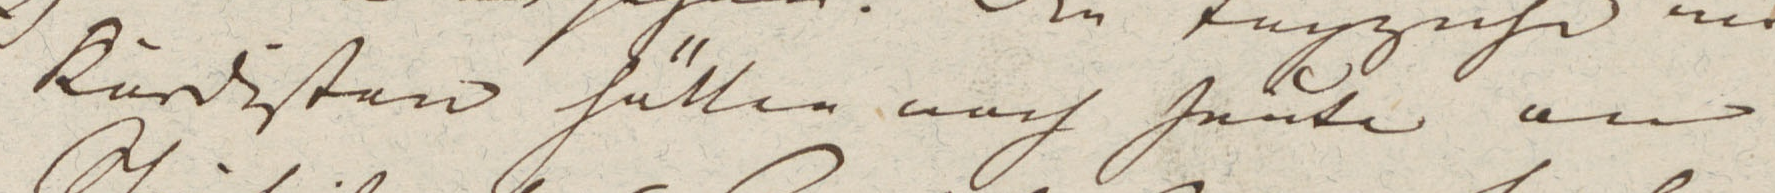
"Kurdistan hätten noch heute an
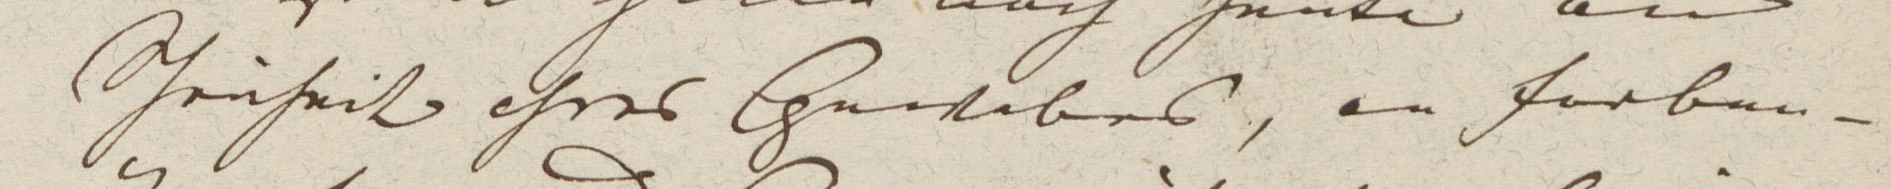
"Schönheit ihres Gewebes, an Farben-
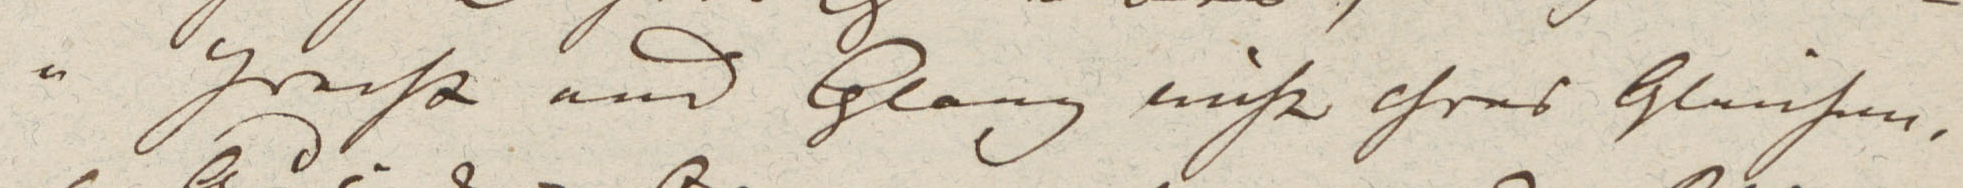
"pracht und Glanz nicht ihres Gleichen.
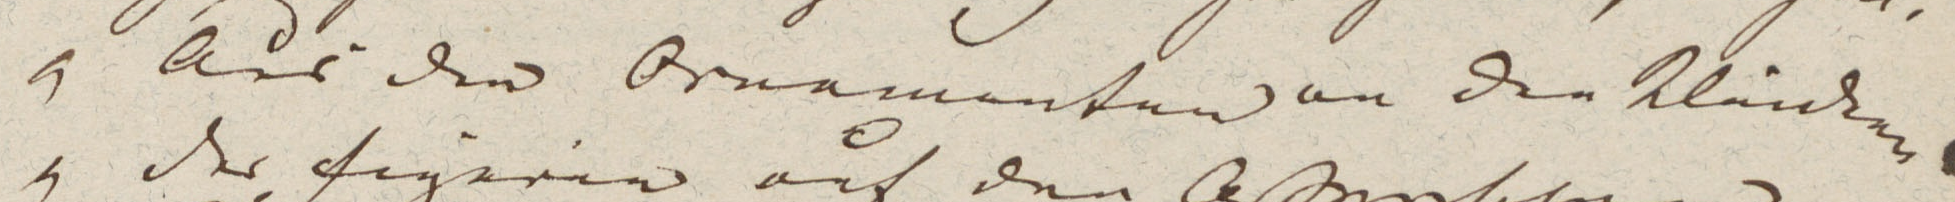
"Aus den Ornamenten an den Kleidern
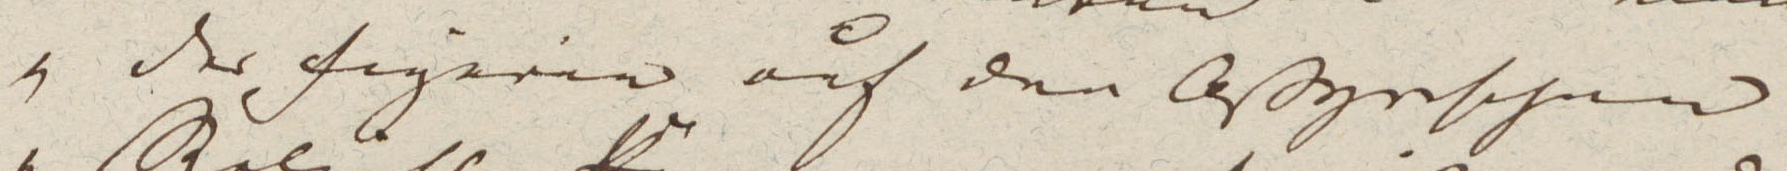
"der Figuren auf den Assyrischen
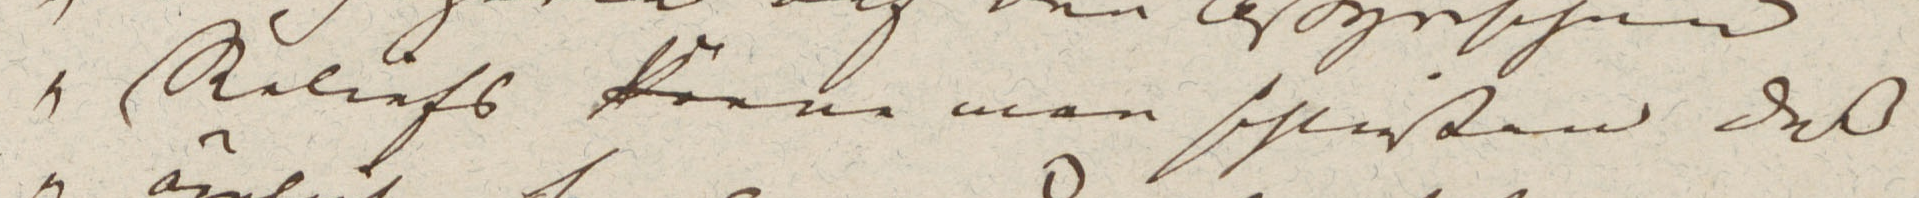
"Reliefs könne man schliessen dass
